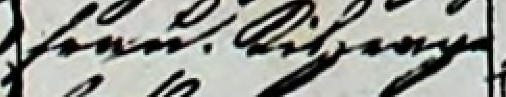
frau. Kitzenge„
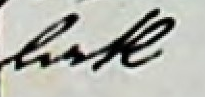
lak
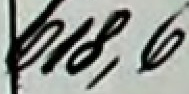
618,6
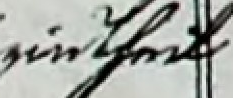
ein Theil
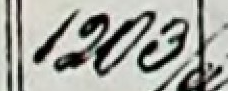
1203/a
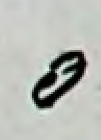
3
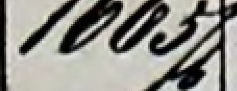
1665/b
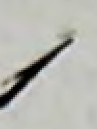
1
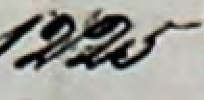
1225
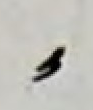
„
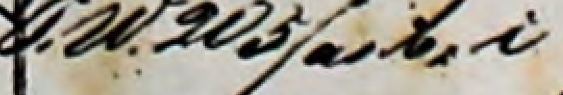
P.W. 205/a b. i
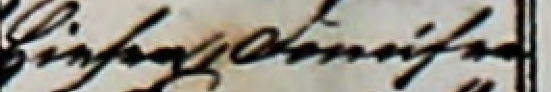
Hiesen ???
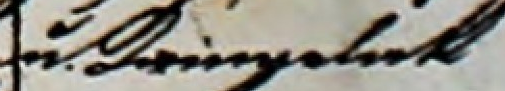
u. Kringelak
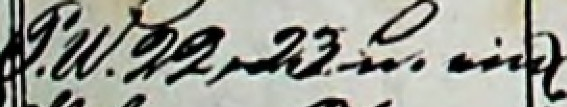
P.W. 22, 23 u. ein
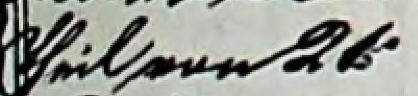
Theil von 26
